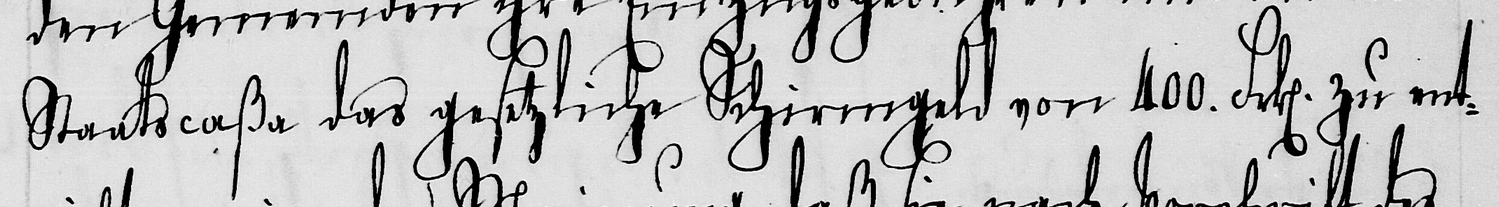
Staatscaßa das gesetzliche Schirmgeld von 400. Frk[en]. zu
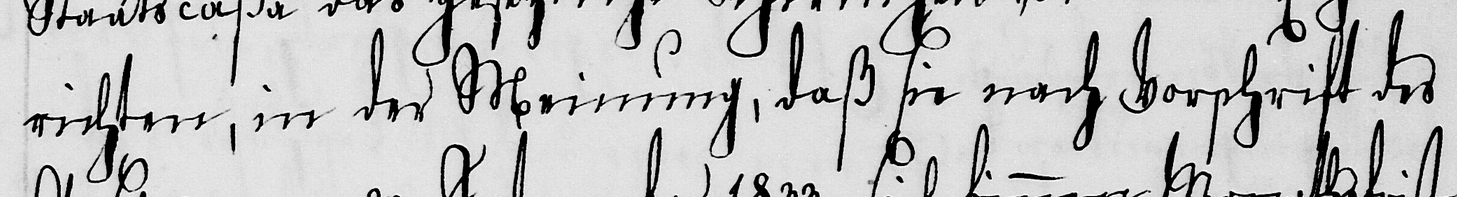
richten, in der Meinung, daß sie nach Vorschrift des
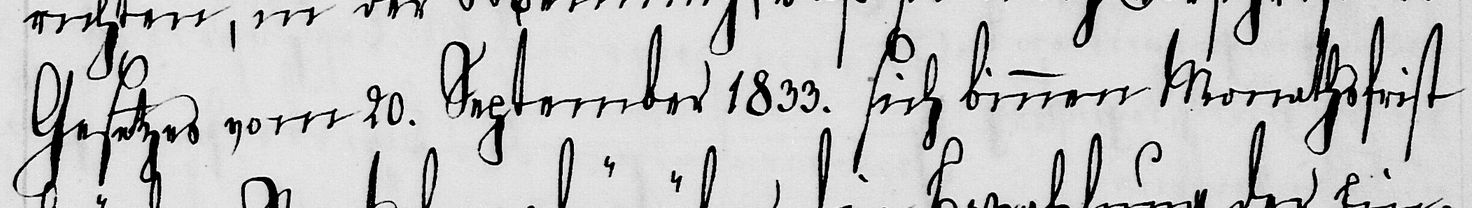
Gesetzes vom 20. September 1833. sich binnen Monathsfrist
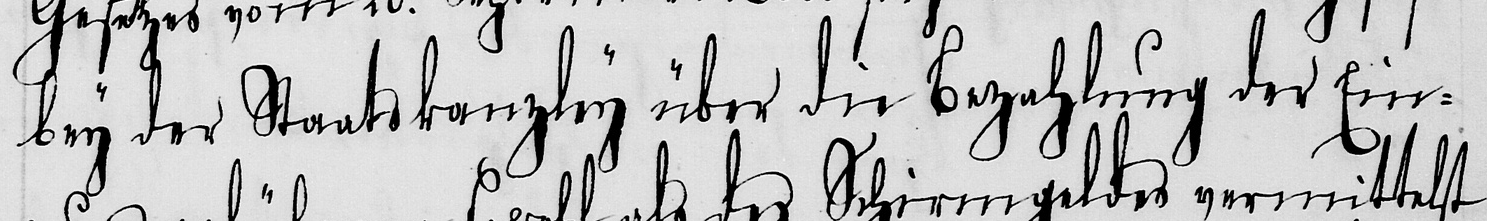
bey der Staatskanzley über die Bezahlung der Ein¬
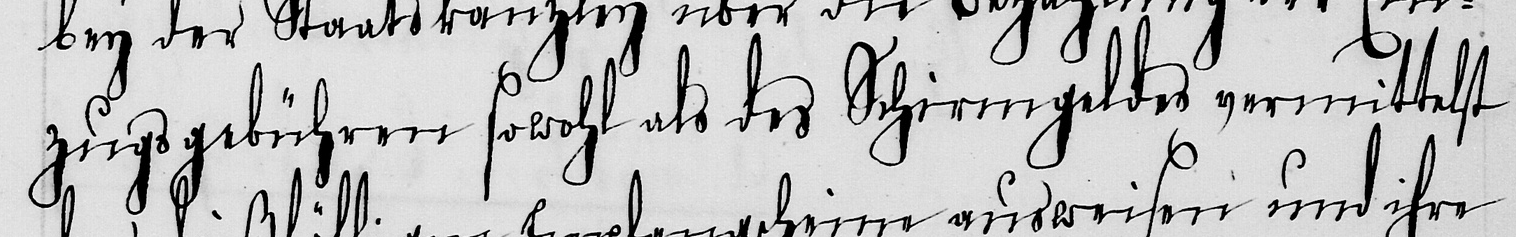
zugsgebühren sowohl als des Schirmgeldes vermittelst
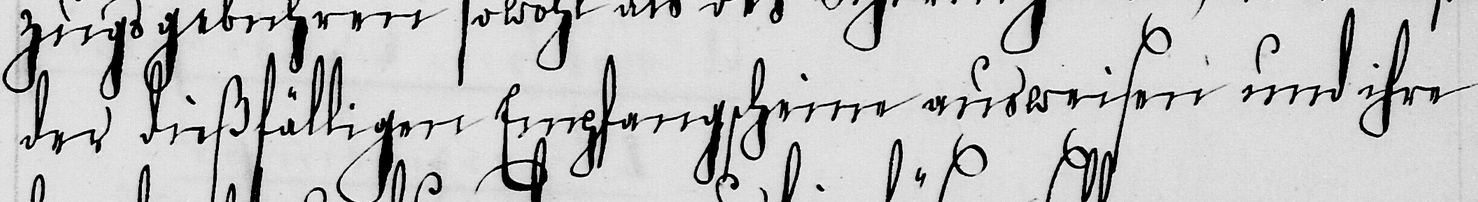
der dießfälligen Empfangscheine ausweisen und ihre
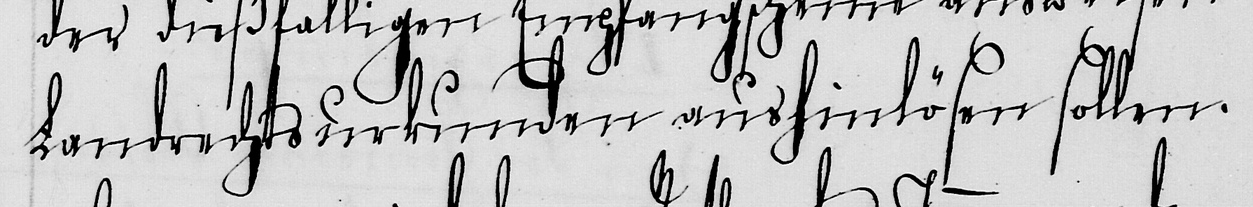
Landrechtsurkunden aushinlösen sollen.
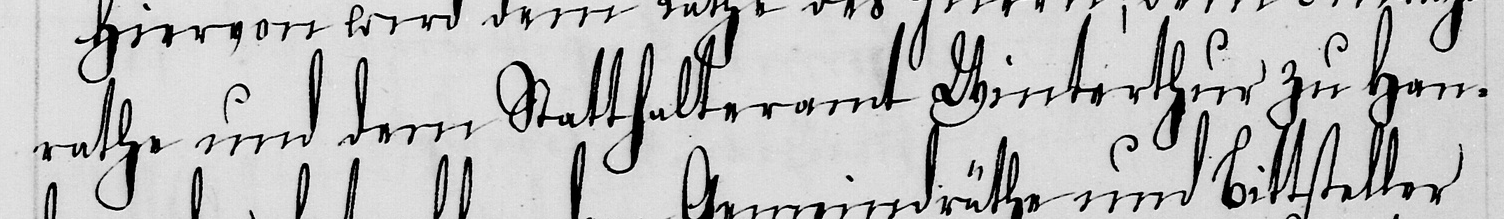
rathe und dem Statthalteramt Winterthur zu Han¬
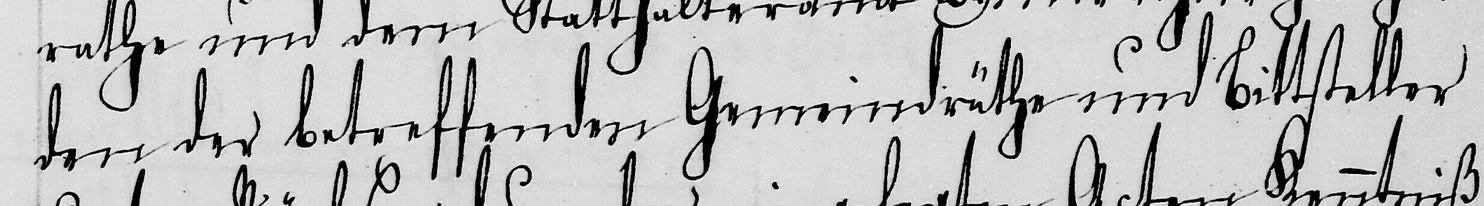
den der betreffenden Gemeindräthe und Bittsteller
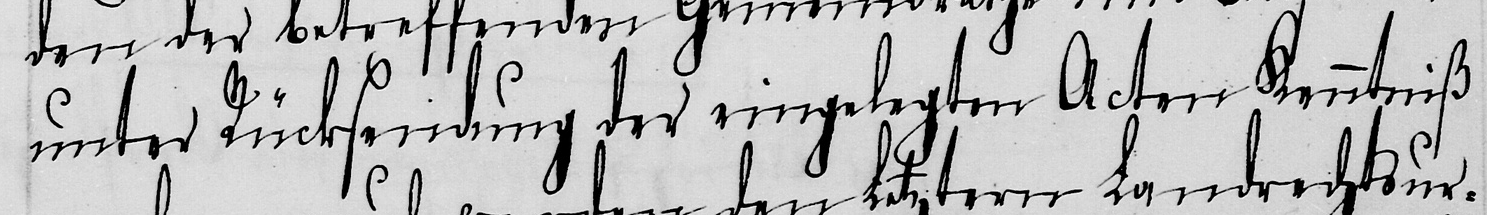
unter Rücksendung der eingelegten Acten Kenntniß
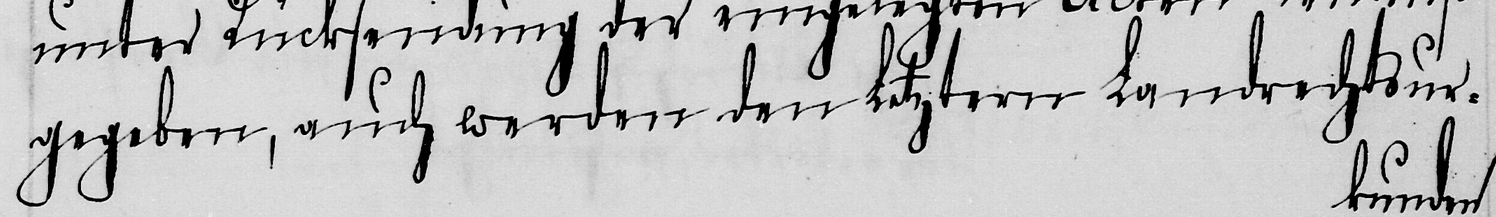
gegeben, auch werden den Letztern Landrechtsur-
